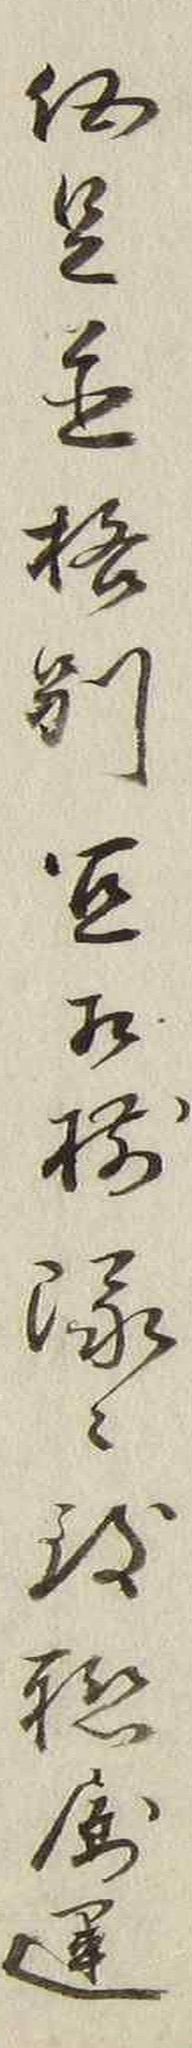伍足並格別宜相揃隊々致聯属運

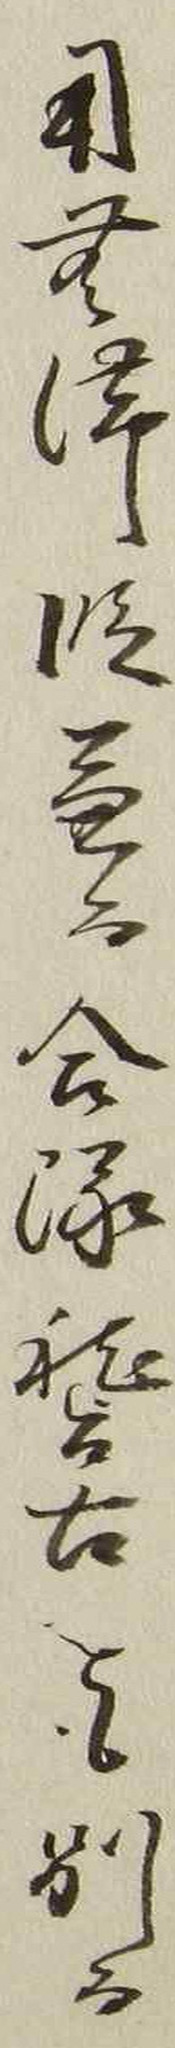用無滞段兼而合隊稽古とも別而
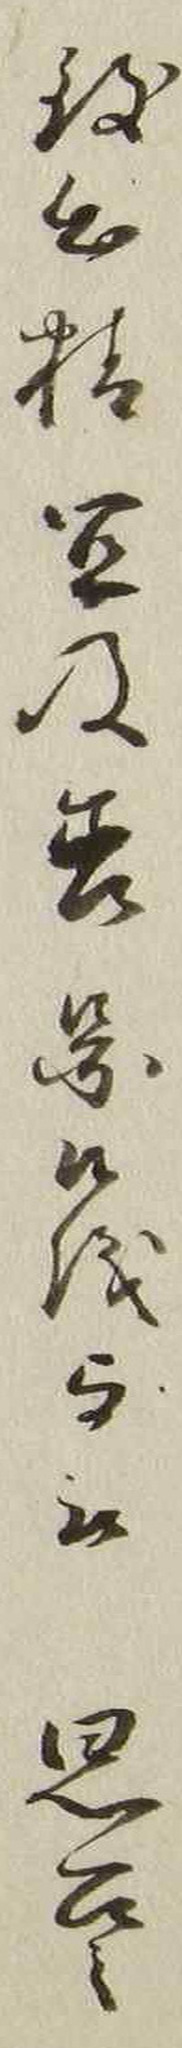致出精宜及差図候儀と被思召之
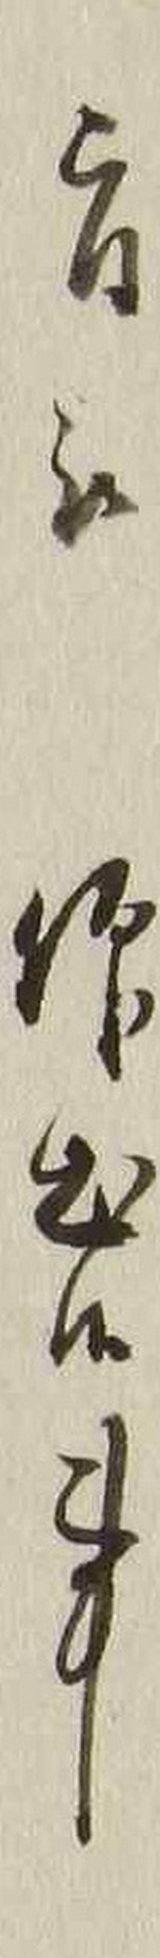旨被仰出候事
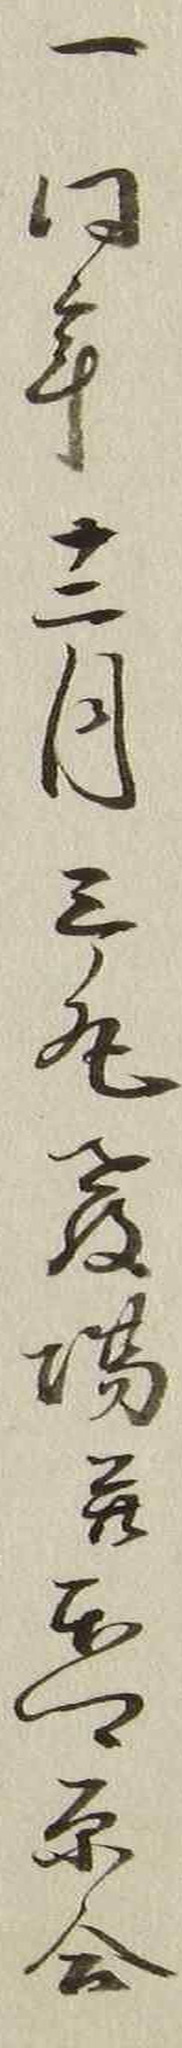一同年十二月三丸教場并本郷原合
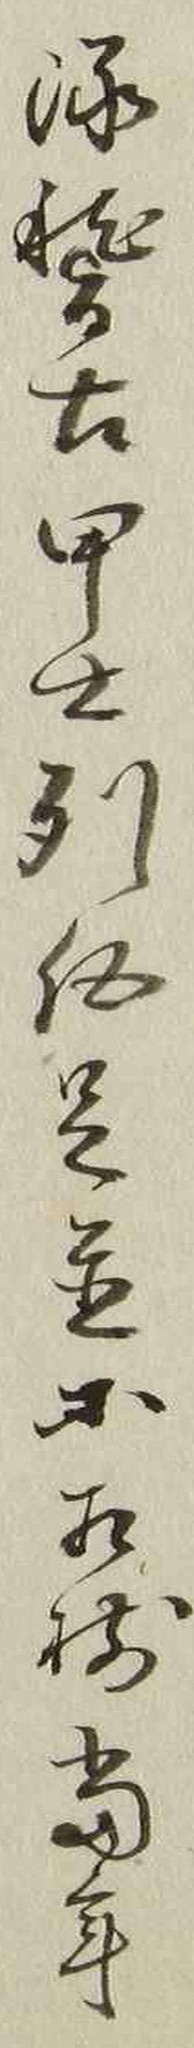隊稽古甲士列伍足並等相揃当年
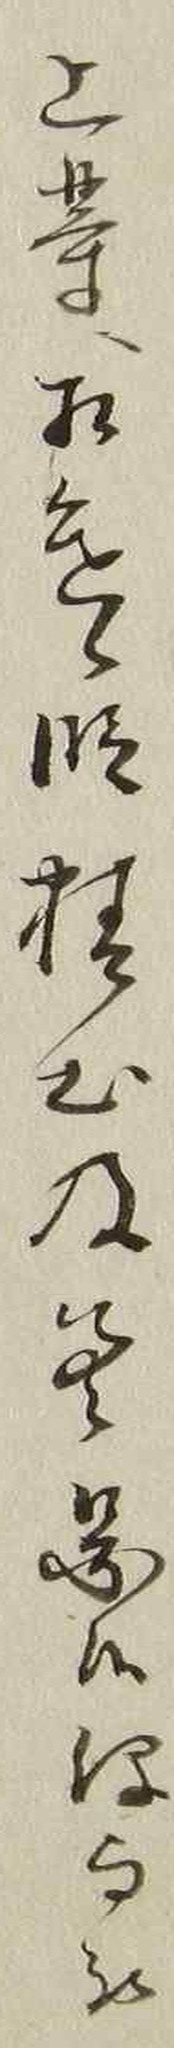上等へ相進候段精出及有図儀と被
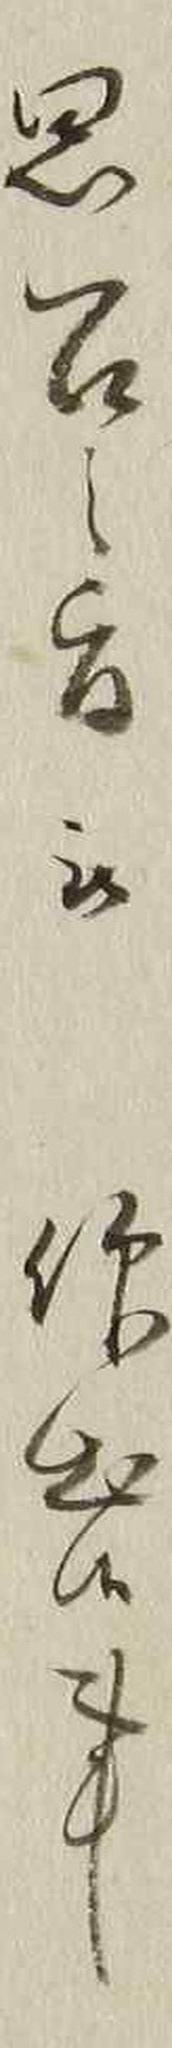思召之旨被仰出候事
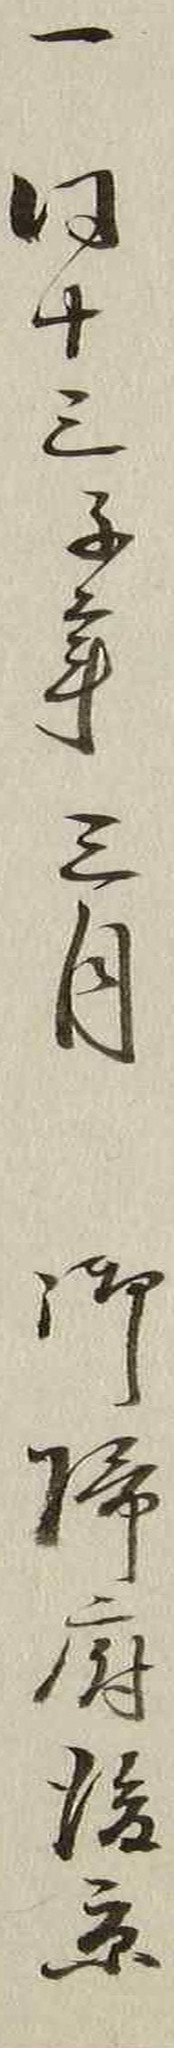一同十三子年三月御帰府後京
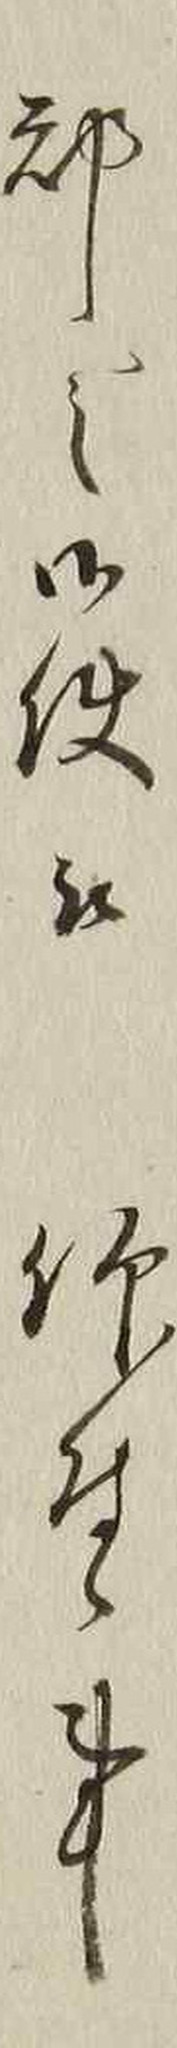都之御使被仰付候事
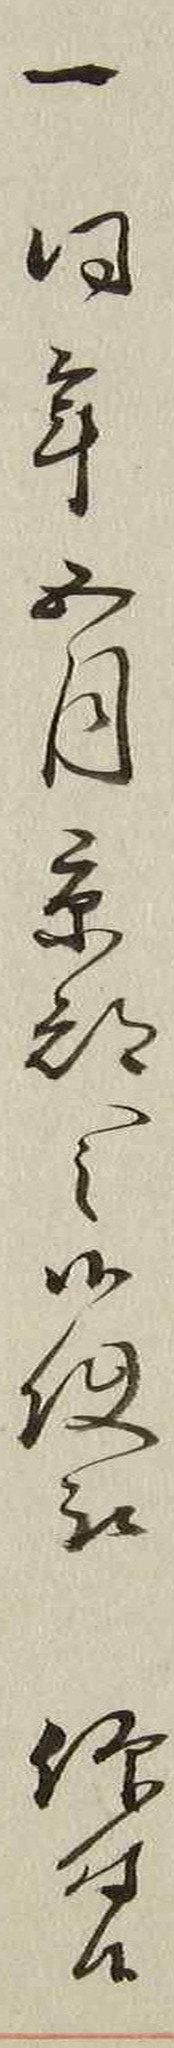一同年五月京都へ之御使被仰付候
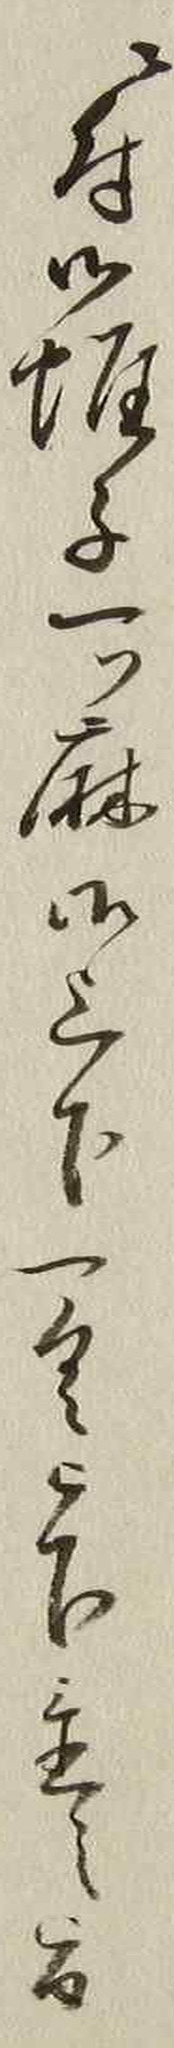に付御帷子一つ麻御上下一具被下置之旨
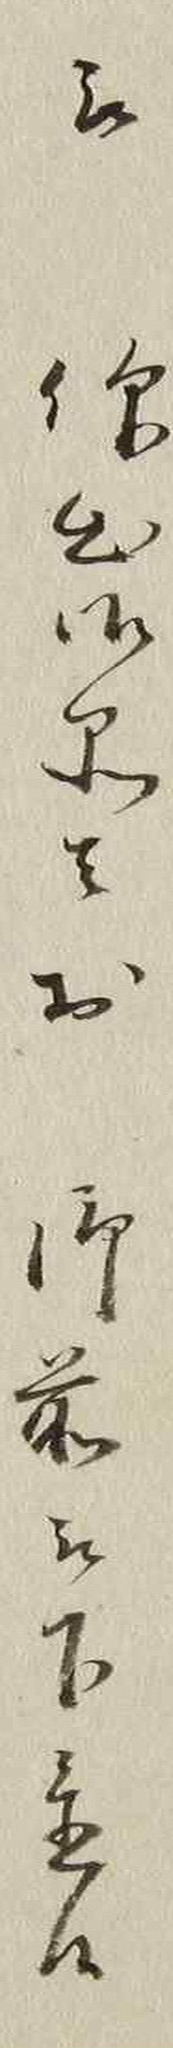被仰出御品は於御前被下置候
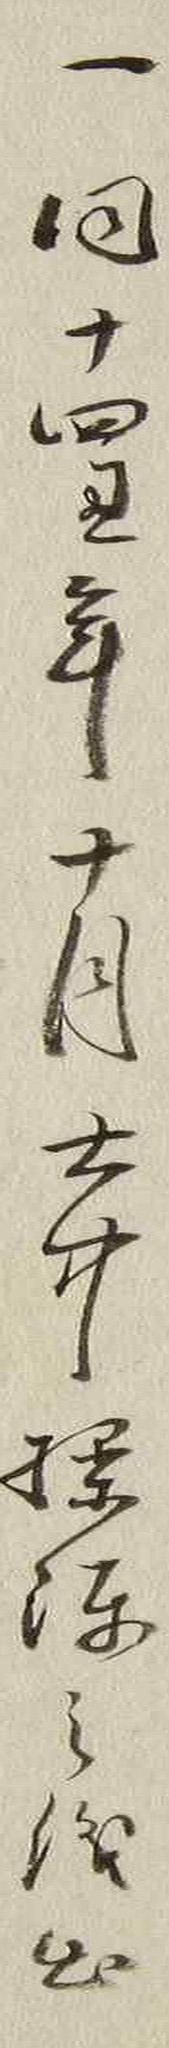一同十四丑年十月士中繰練之儀出
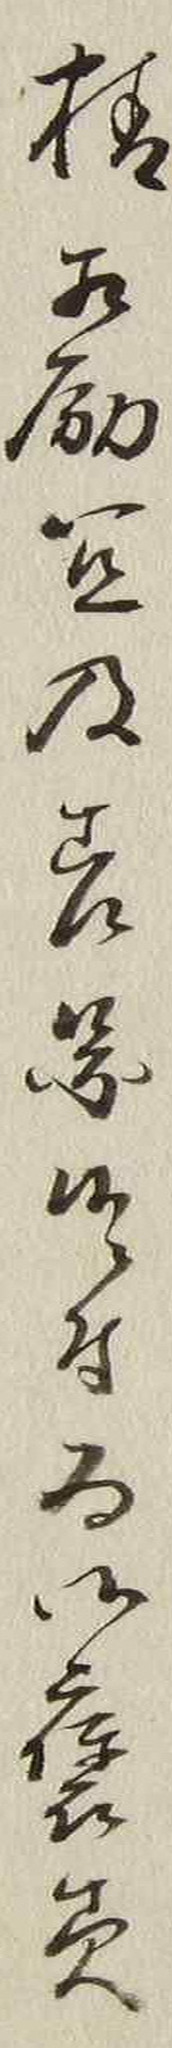精有励宜及差図候に付為御褒美
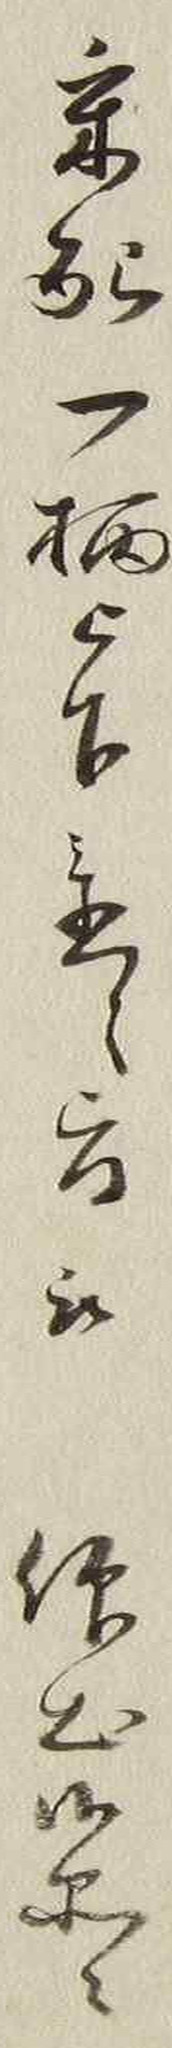采配一柄被下置之旨被仰出御品同
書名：諸士系譜　巻之159　な之部1
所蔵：会津若松市立会津図書館
